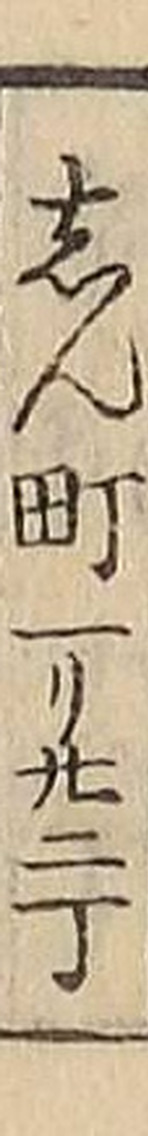しん町一リ廿二丁
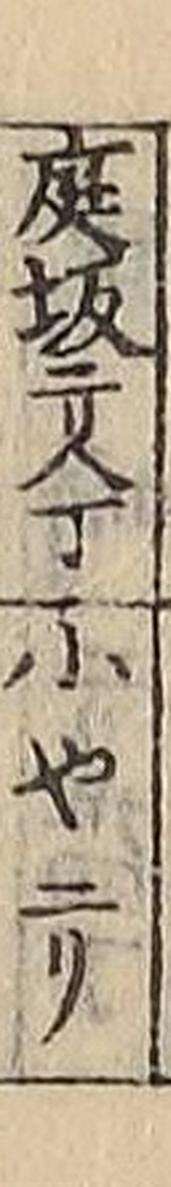庭坂二リ八丁小や二リ
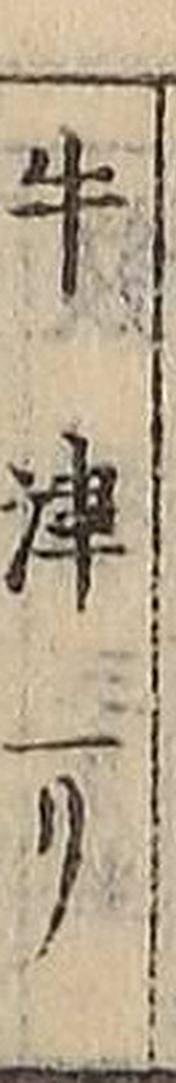牛津一リ
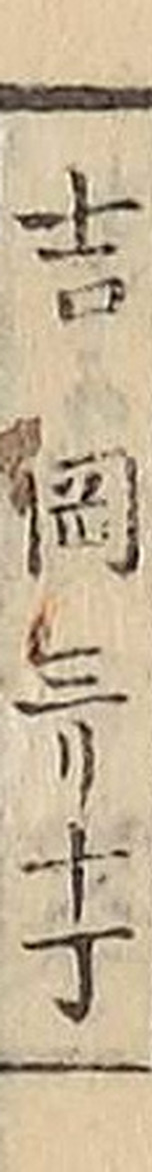吉岡三リ十丁
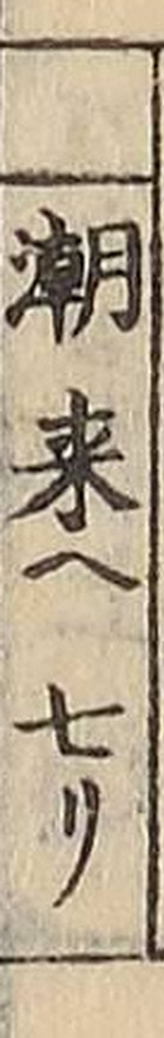朝来へ七リ
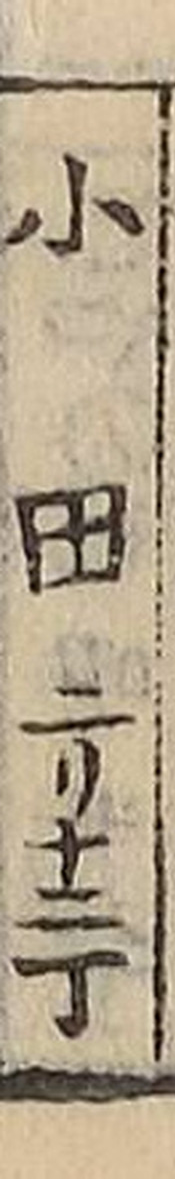小田二リ十二丁
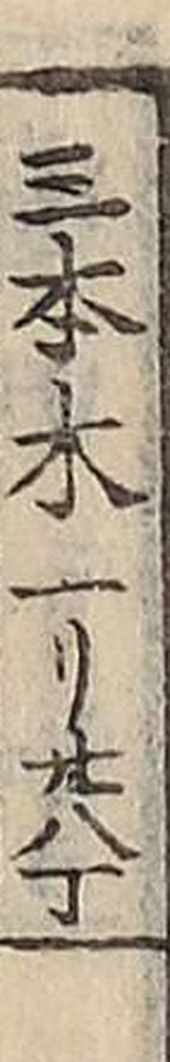三本木一リ廿八丁
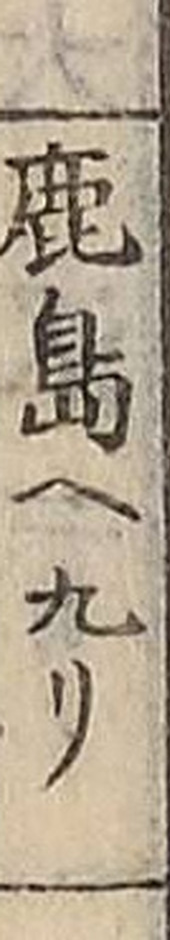鹿島へ九リ
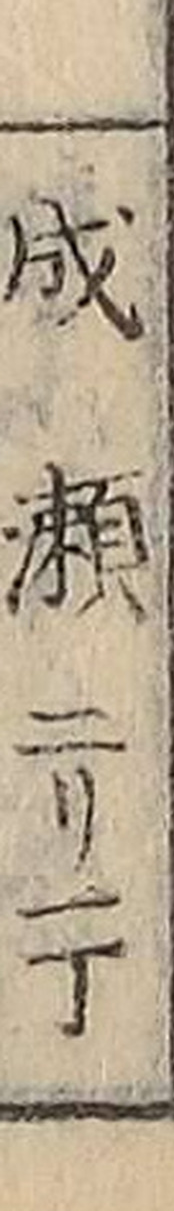成頼二リ一丁
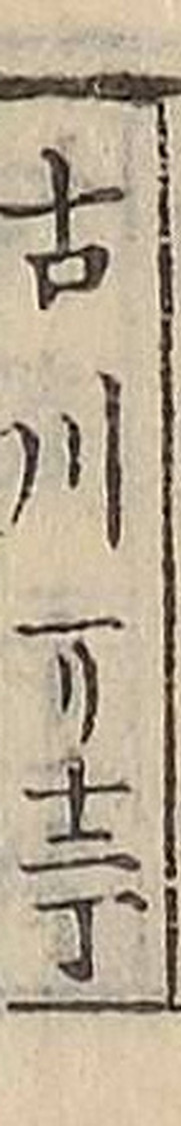古川一リ十二丁
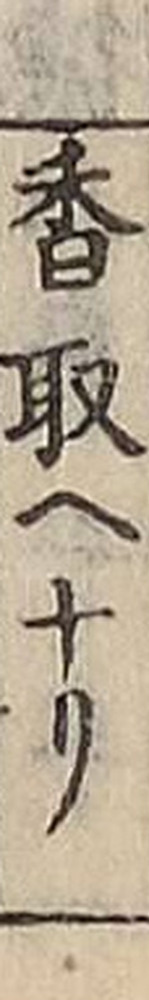香取へ十リ
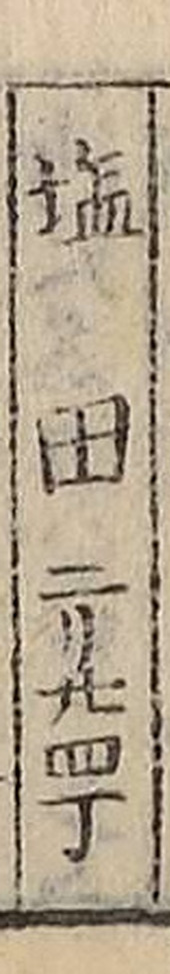塩田二リ廿四丁
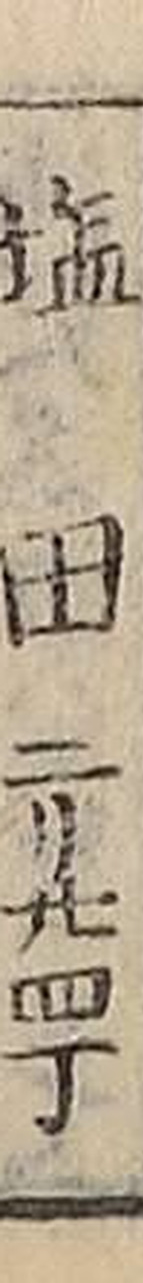塩田二リ廿四丁
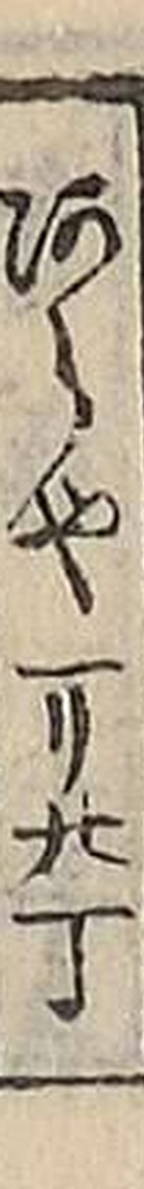あらや一リ廿丁
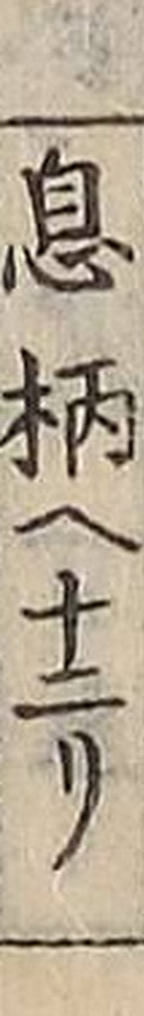息柄へ十二リ
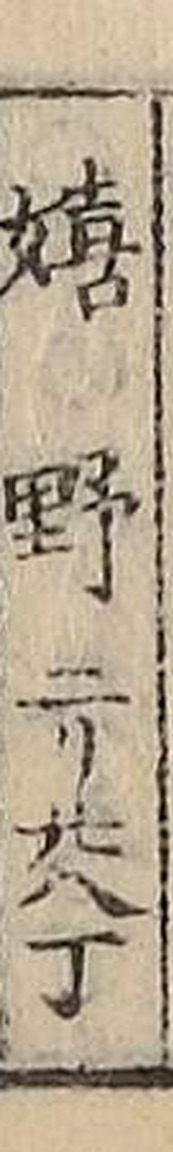嬉野二リ廿八丁
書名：旅行用心集
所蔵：神戸大学附属図書館 国文学研究資料館
